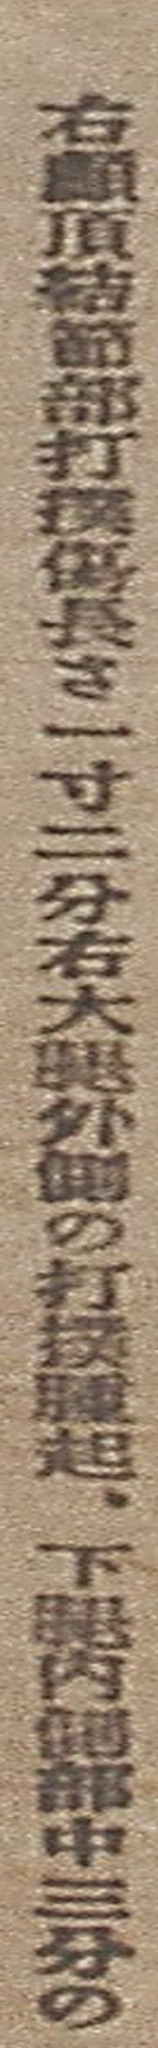右顱頂結節部打撲傷長さ一寸二分右大腿外側の打撲腫起、下腿内側部中三分の
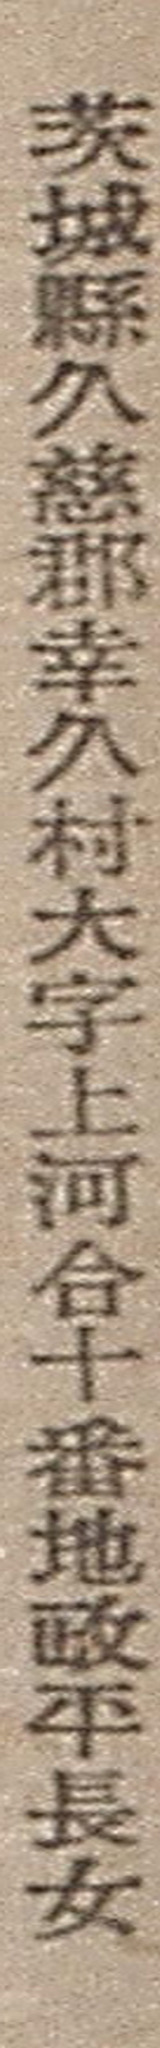茨城県久慈郡幸久村大字上河合十番地政平長女
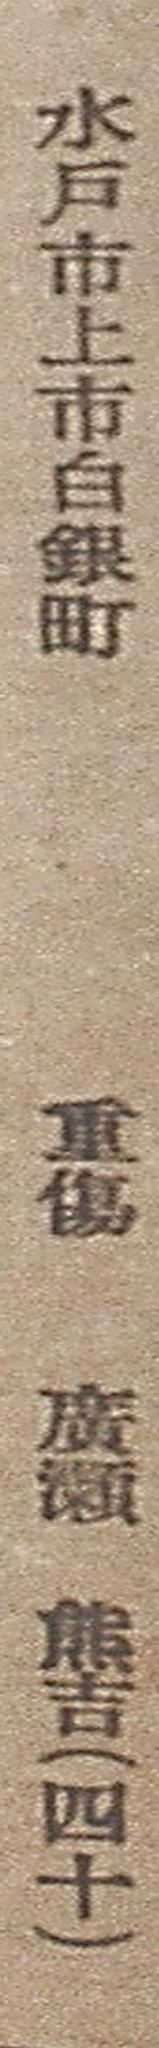水戸市上市白銀町重傷廣瀬熊吉

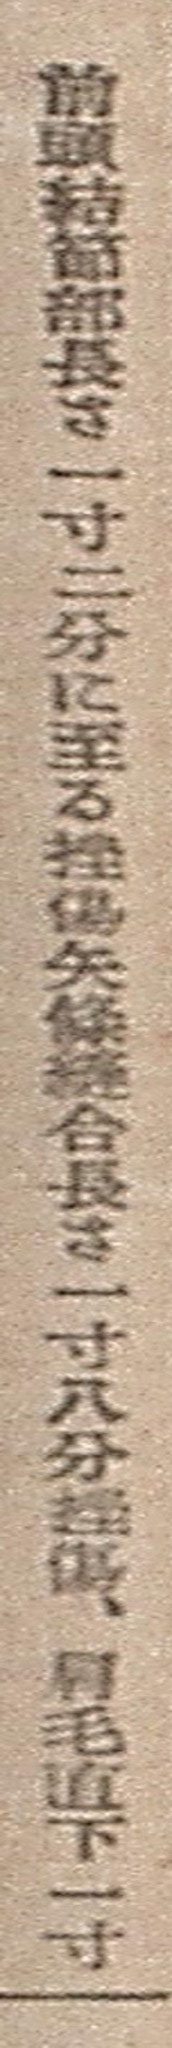前頭結節部長さ一寸二分に至る挫傷矢条縫合長さ一寸八分挫傷、眉毛直下一寸
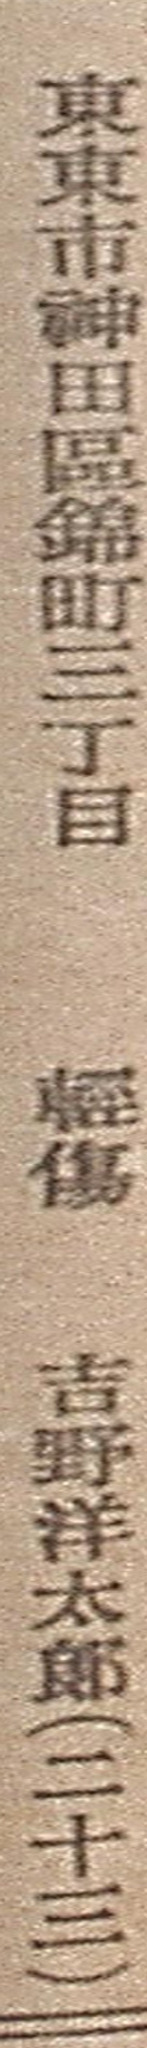東京市神田区錦町三丁目軽傷吉野洋太郎
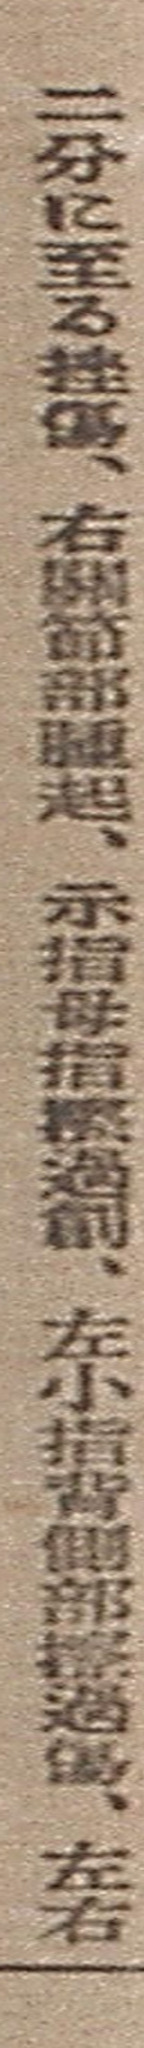二分に至る挫傷、右関節部腫起、示指母指擦過創、左小指背側部擦過傷、左右
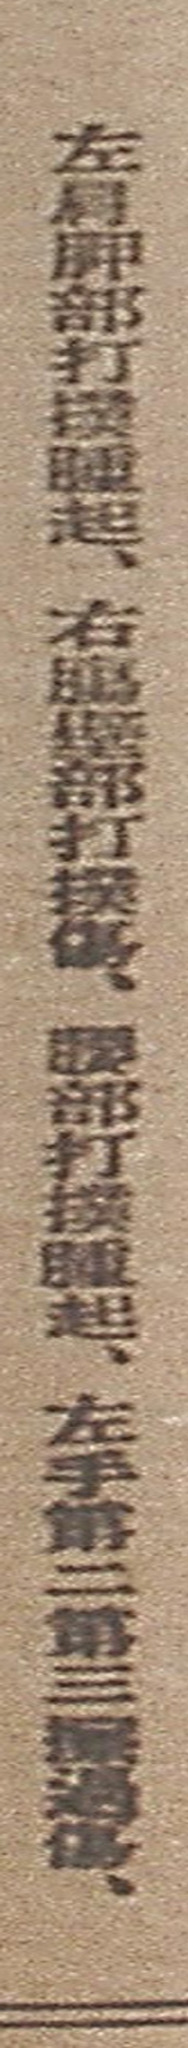左肩胛部打撲腫起、右腹壁部打撲傷、腰部打撲腫起、左手第二第三擦過傷、
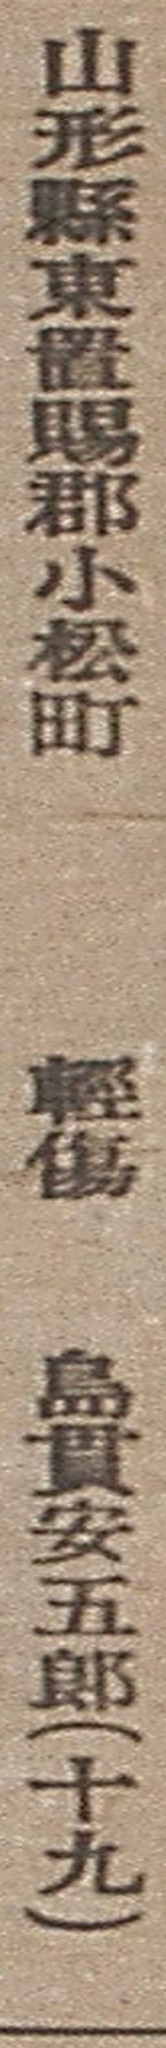山形県東置賜郡小松町軽傷島貫安五郎
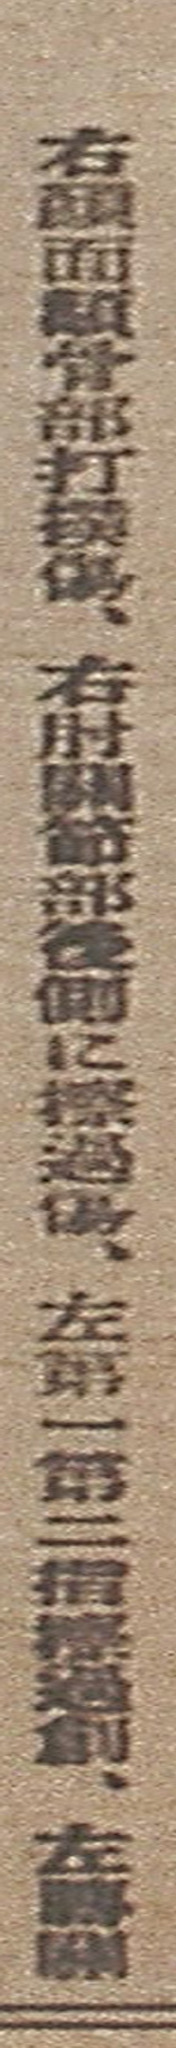右顔面額骨部打撲傷、右肘関節部後側に擦過傷、左第一第二指擦過創、左膊関
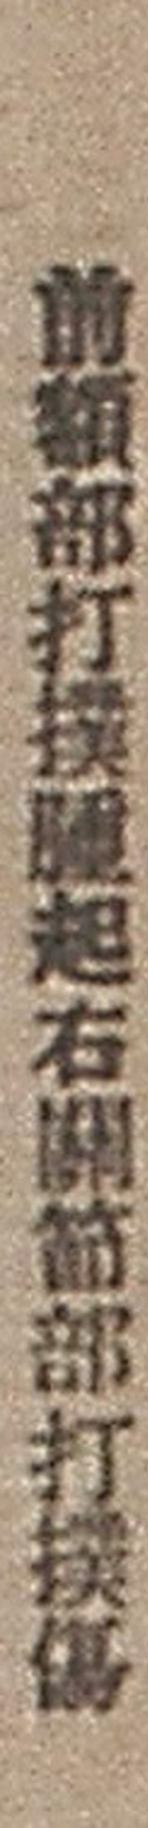前額部打撲腫起右関節部打撲傷
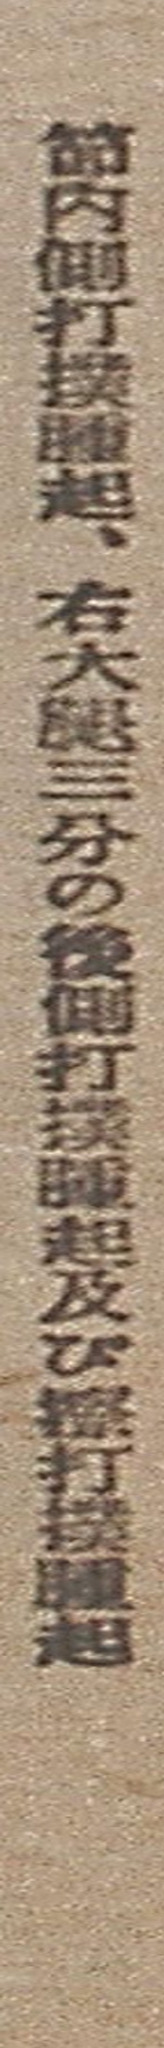節内側打撲腫起、右大腿三分の後側打撲腫起及び擦打撲腫起
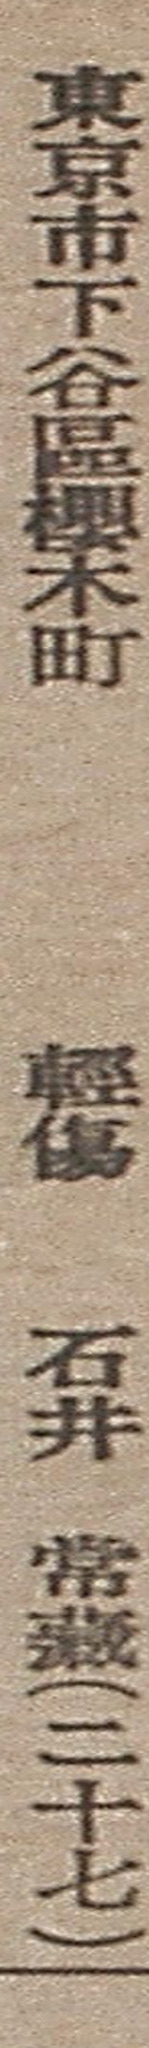東京市下谷区桜木町軽傷石井常蔵
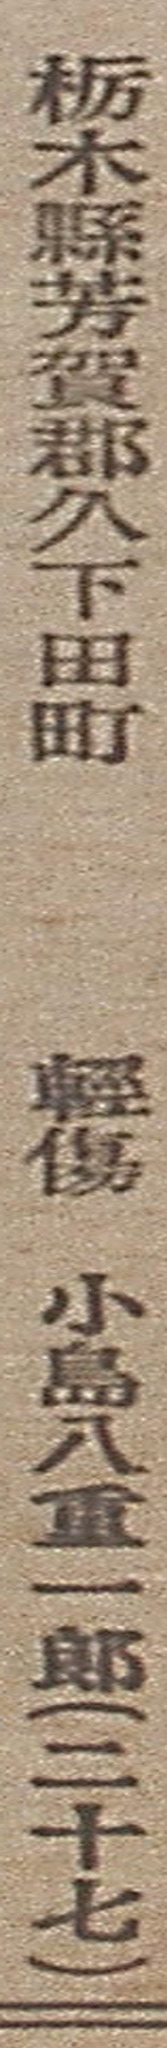栃木県芳賀郡久下田町軽傷小島八重一郎
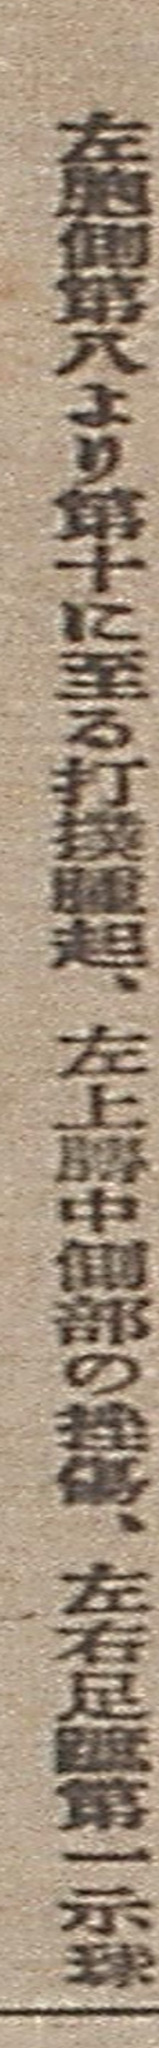左胞側第八より第十に至る打撲腫起、左上腿中側部の挫傷、左右足蹠第一示球
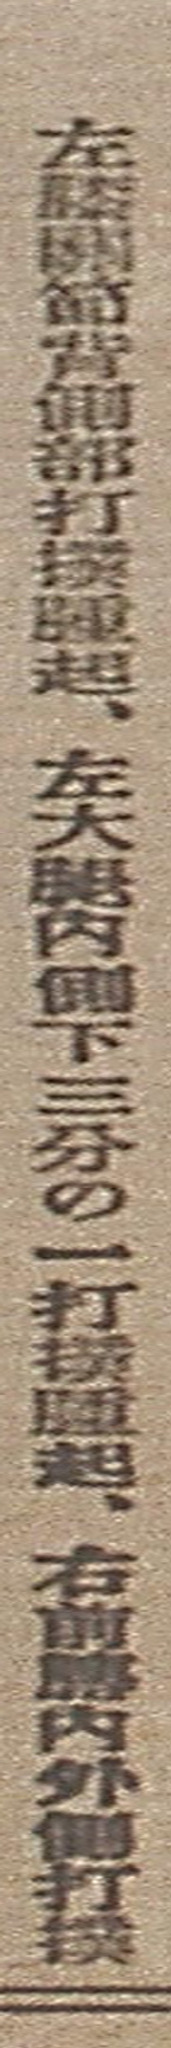左膝関節背側部打撲腫起、左大腿内側下三分の一打撲腫起、右前膊内外側打撲
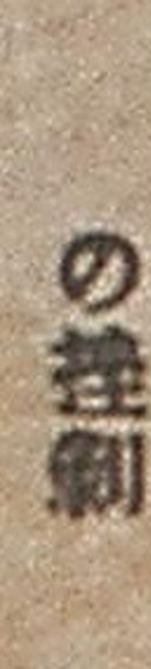の挫剥
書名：風俗畫報臨時増刊第百九十九號　明治三十二年十月各地災害圖會（前編之續）
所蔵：東京大学地震研究所図書室 Earthquake Research Institute Library, The University of Tokyo, JAPAN
